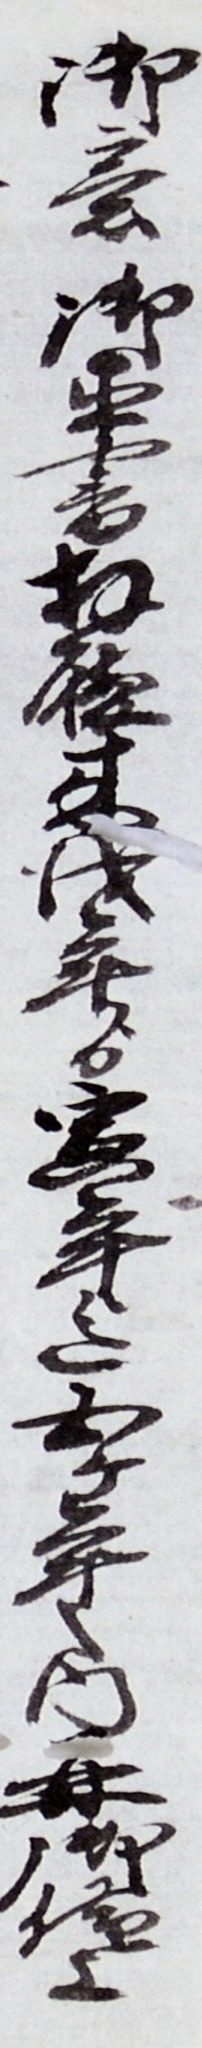御意御車番拝木材年より寅年迄五ヶ年之内御上
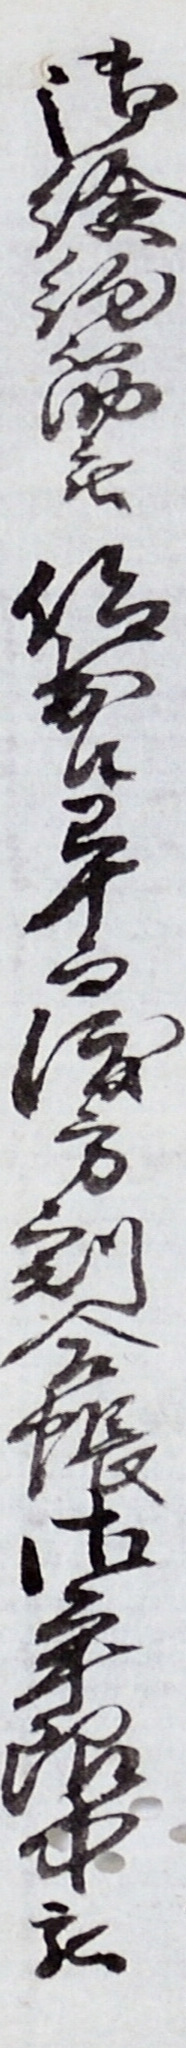御倹約筋被仰出候畢而渡方割合帳御年限中被
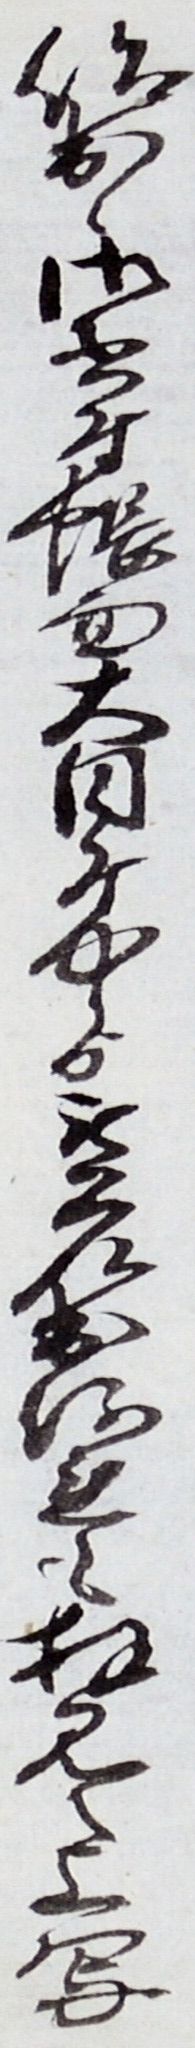仰出候御書付帳面大目付中より被差出何れも拝見之上写
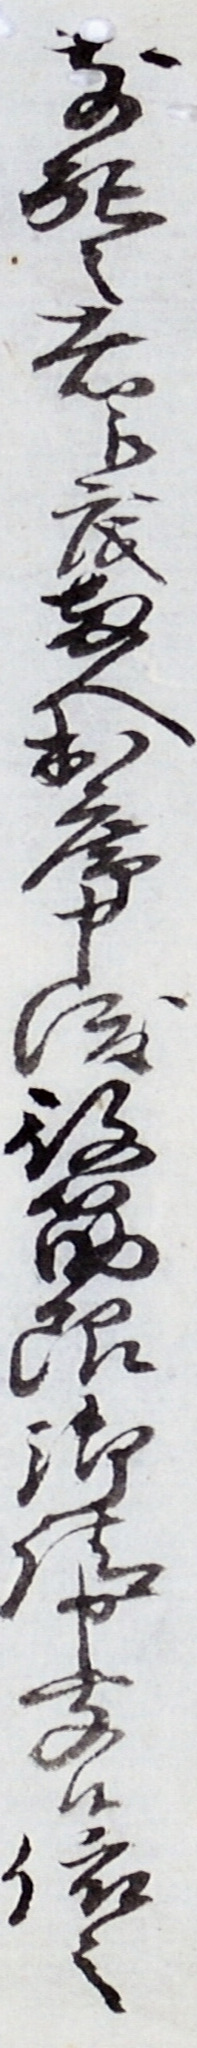支配之者江も両人出席申渡役筋限御請申聞候依之
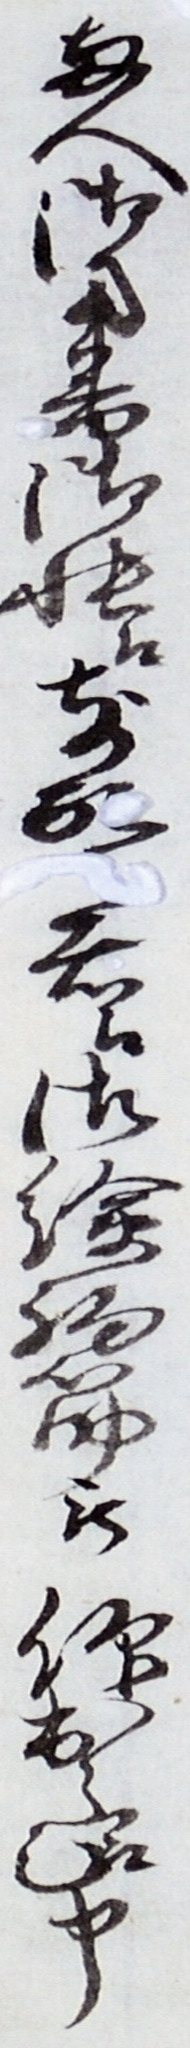両人御用番御帳江支配者江御倹約筋被仰出候趣申
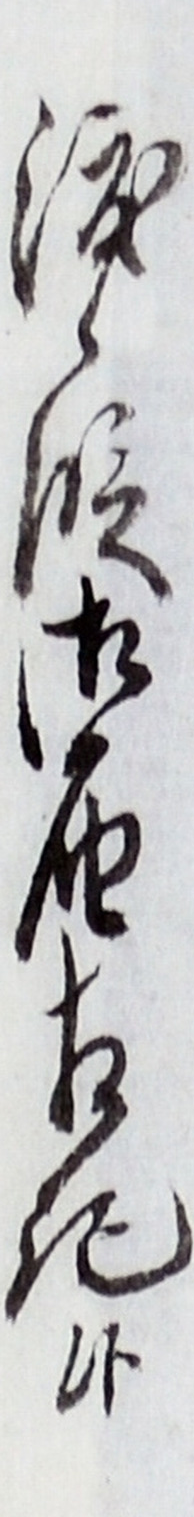渡候段御届相記候
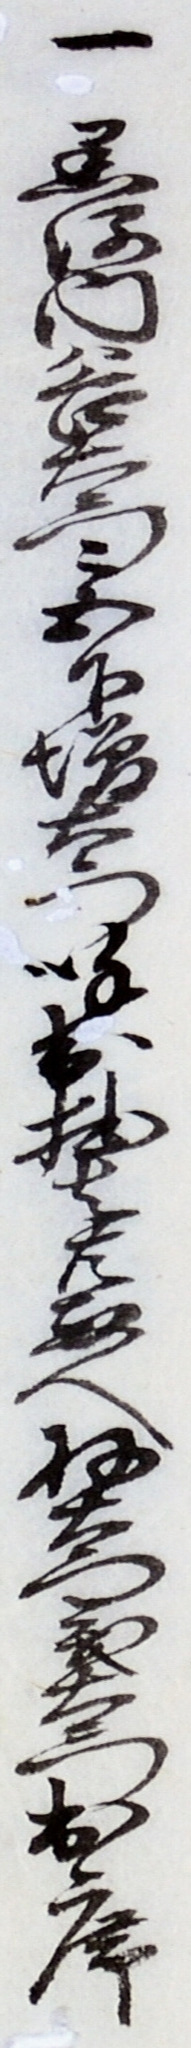一黒河内善右衛門殿宮下増右衛門呼出拙は両人羽右衛門義右衛門出席
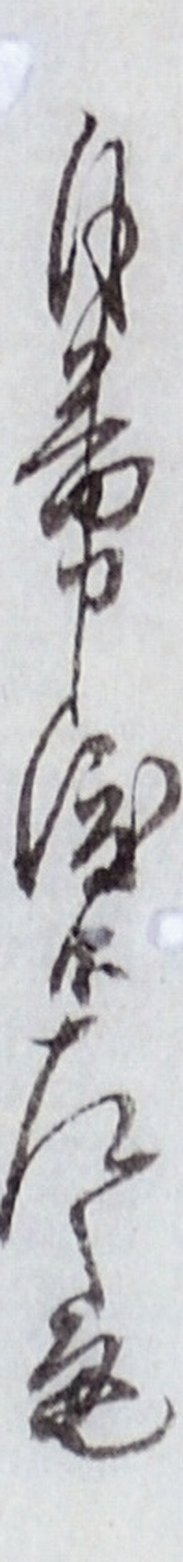月番申渡候左之通
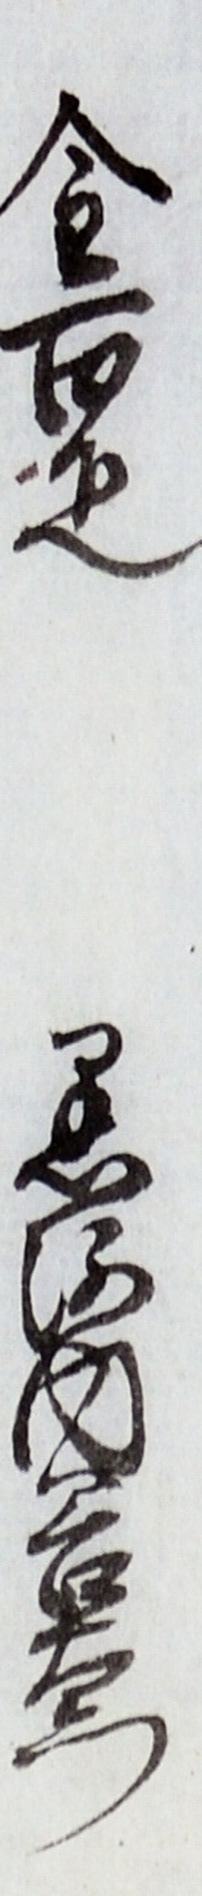金百疋黒河内善右衛門
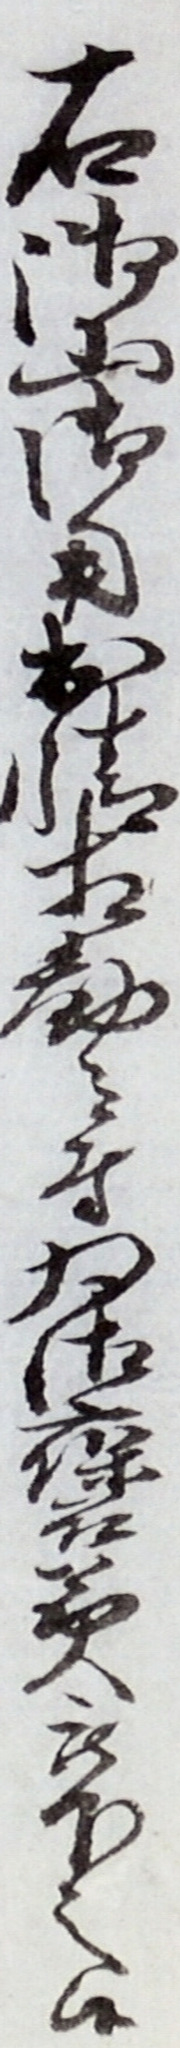右御山御用書帳相勤候ニ付為御褒美被下之候
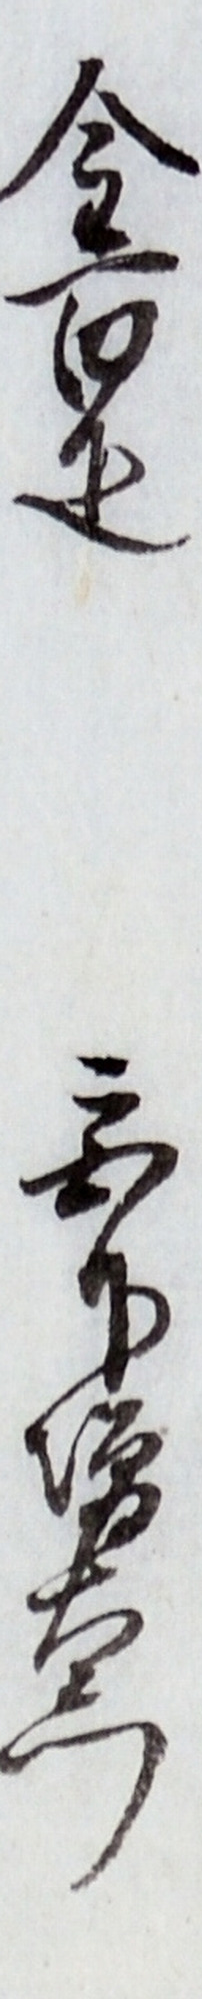金百疋宮下増右衛門
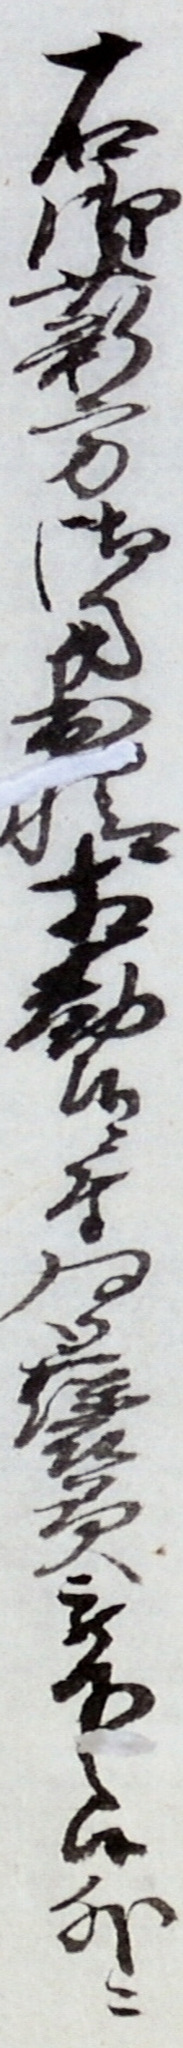右御薪方御用書帳相勤候ニ付為御褒美被下之候外ニ
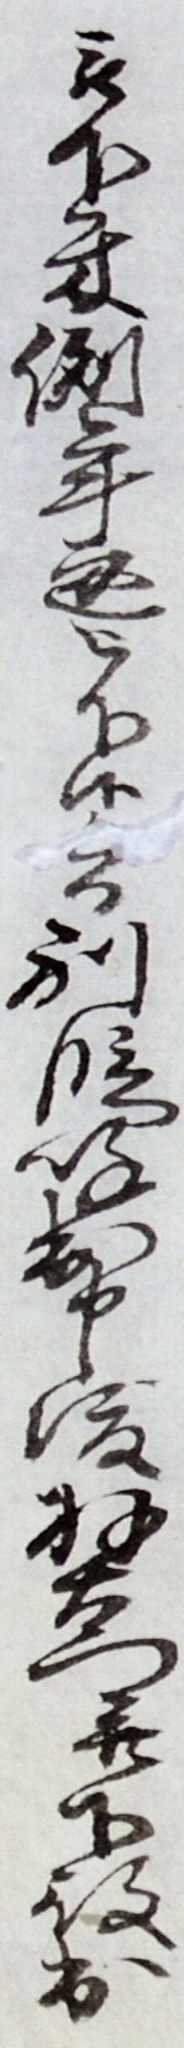被下米例年通被下候旨別段呼出申渡羽右衛門并下役出
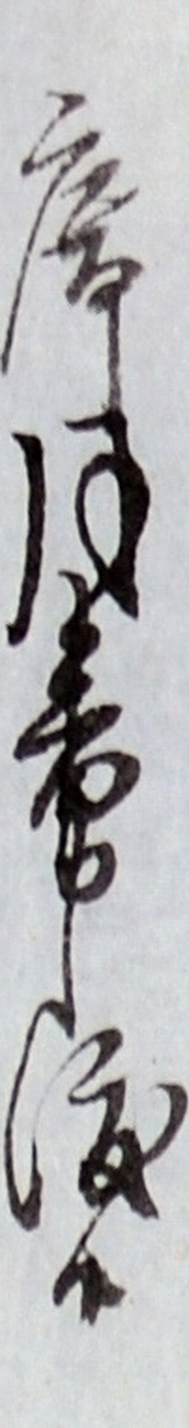席月番申渡候
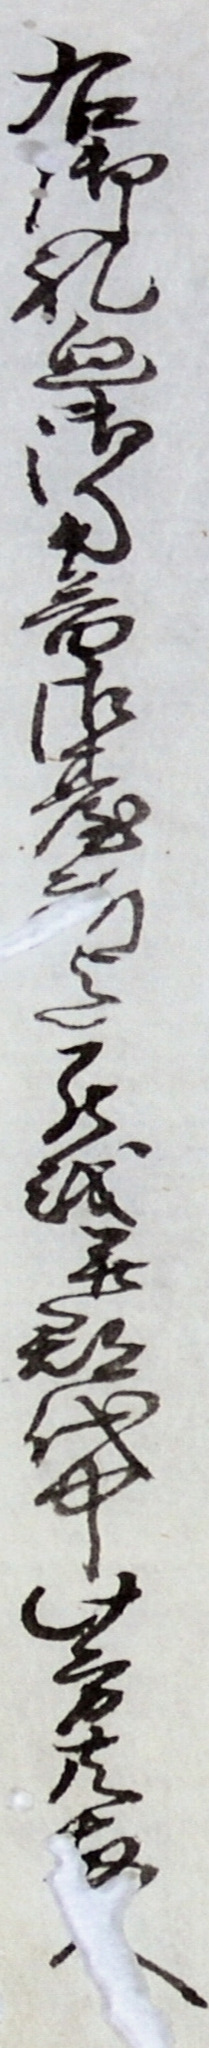右御礼廻御用番御台迄罷越并郡代中此方共両人
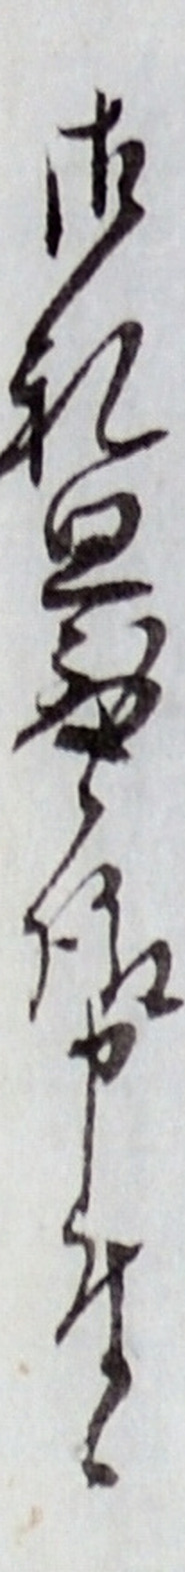御礼廻候様申付候
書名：御山奉行御用控
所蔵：伊那市立高遠町図書館・合同会社AMANE
